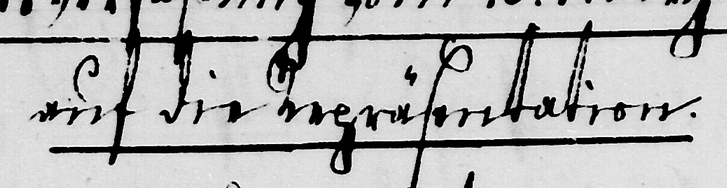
auf die Repräsentation.
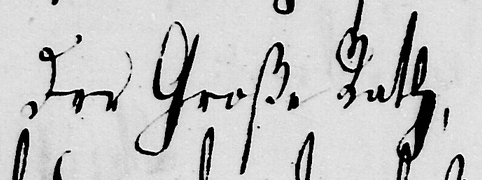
Der Große Rath,
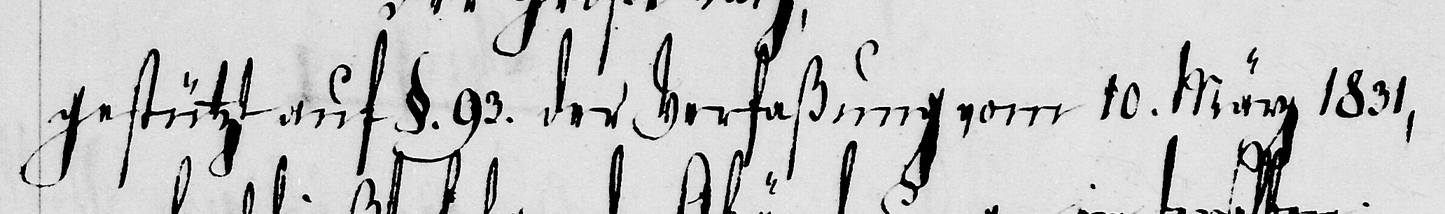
gestützt auf §. 93. der Verfaßung vom 10. März 1831,
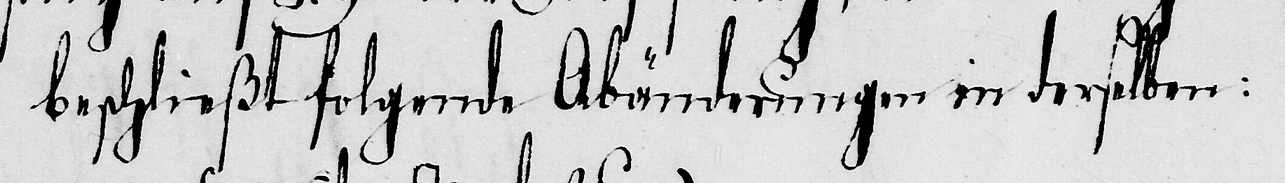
beschließt folgende Abänderung in derselben:
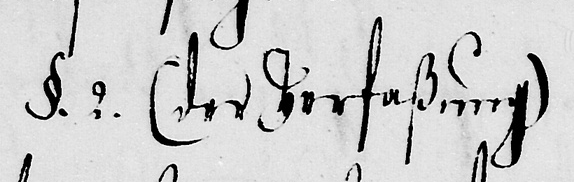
2. (der Verfaßung)
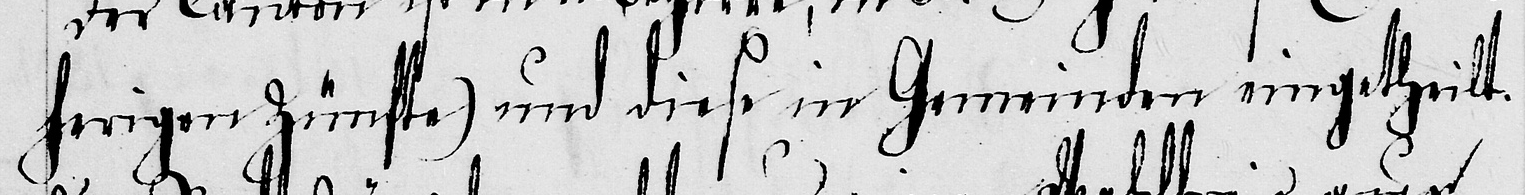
herigen Zünfte) und diese in Gemeinden eingetheilt.
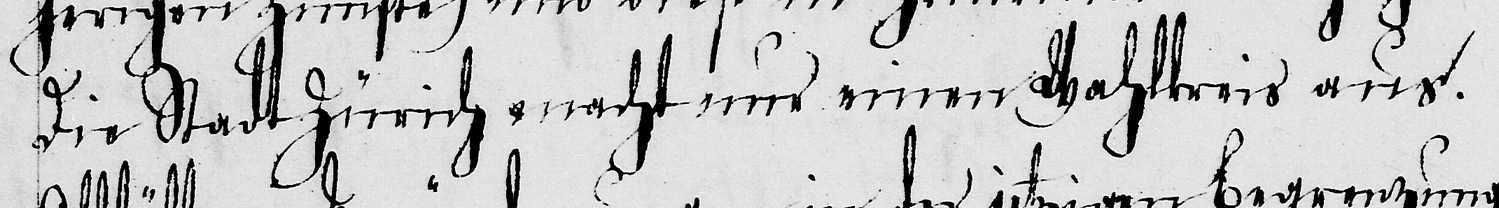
Die Stadt Zürich macht nur einen Wahlkreis aus.
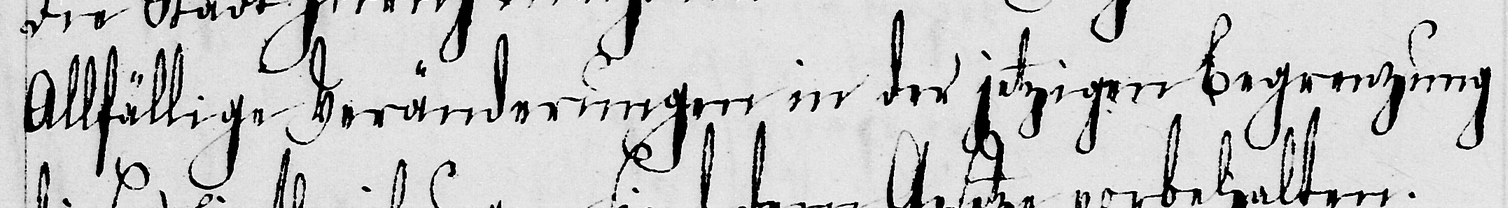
Allfällige Veränderungen in der jetzigen Begrenzung
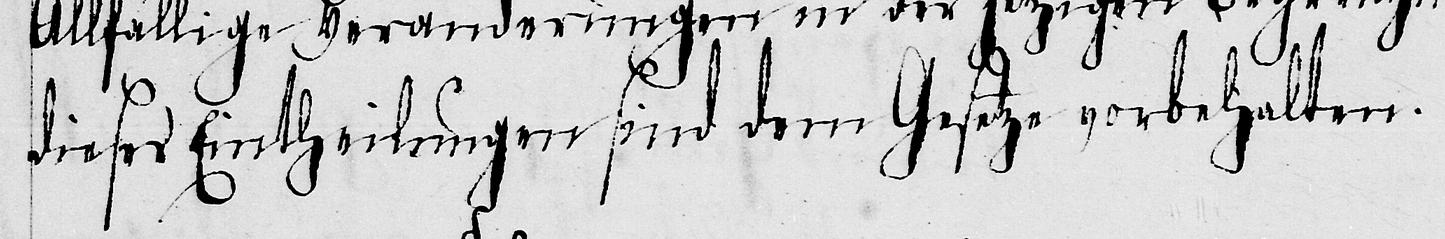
dieser Eintheilung sind dem Gesetze vorbehalten.
